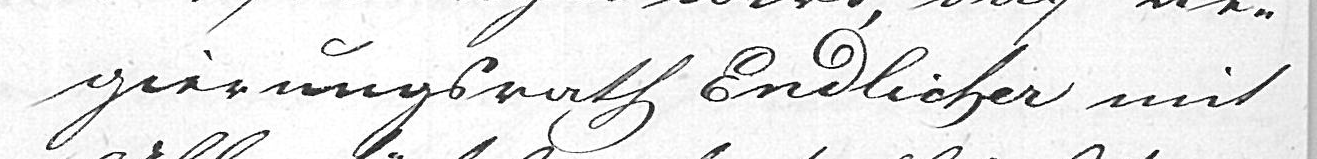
gierungsrath Endlicher mit
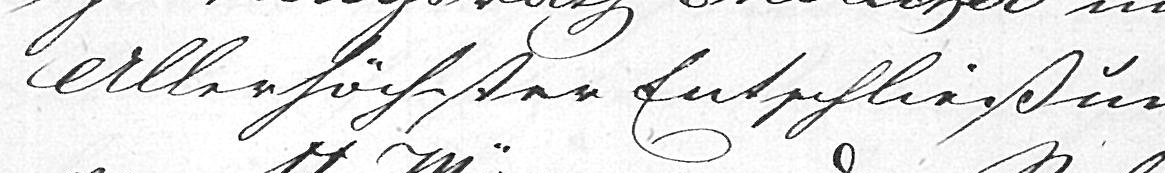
Allerhöchster Entschließung
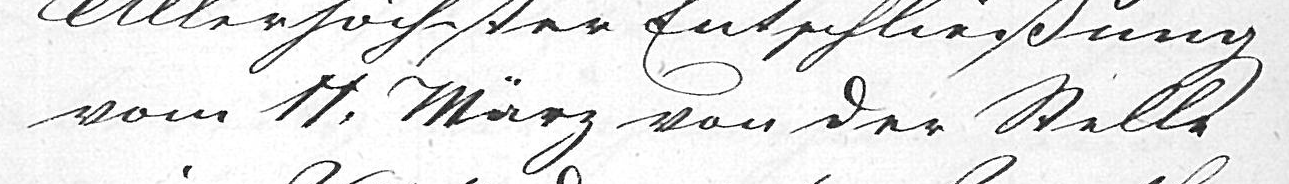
vom 11. März von der Stelle
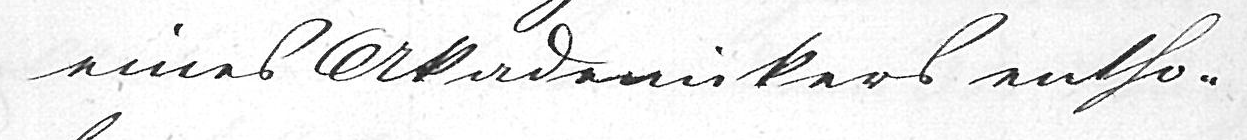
eines Akademikers entho-
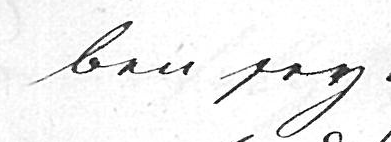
ben sey.
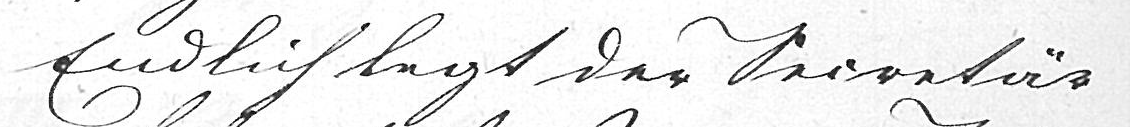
Endlich legt der Secretär
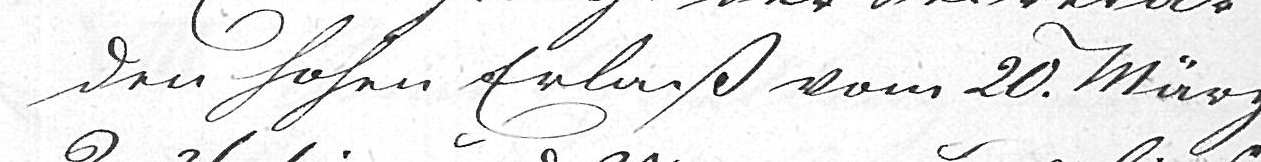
den hohen Erlaß vom 20. März
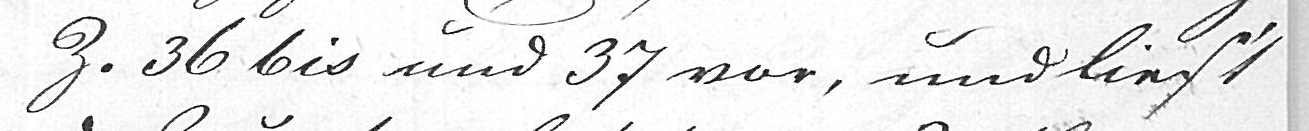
Z. 36 bis und 37 vor, und liest
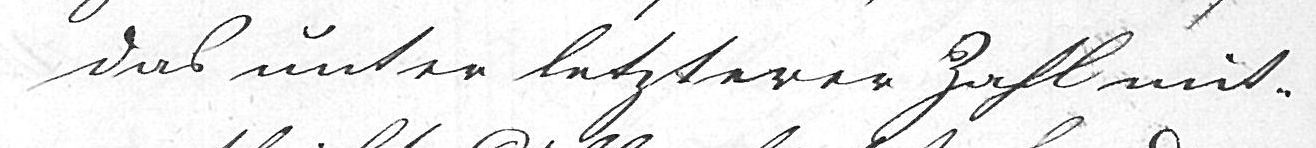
das unter letzterer Zahl mit-
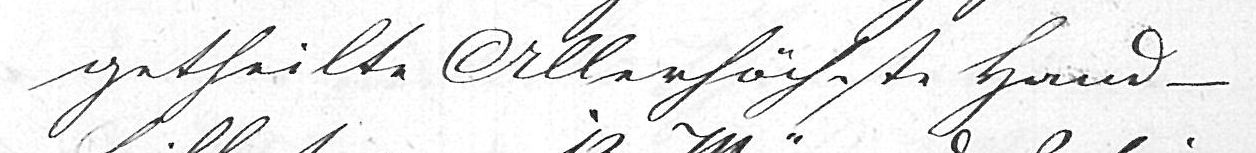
getheilte Allerhöchste Hand-
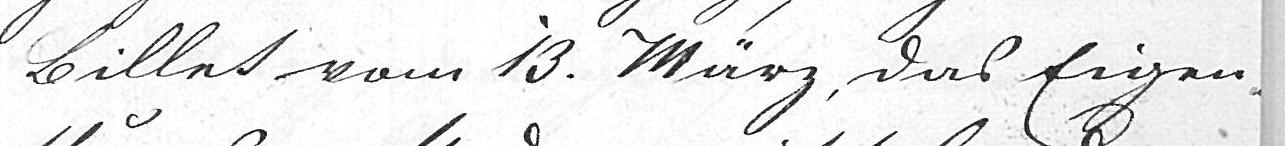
Billet vom 13. Marz, das Eigen-
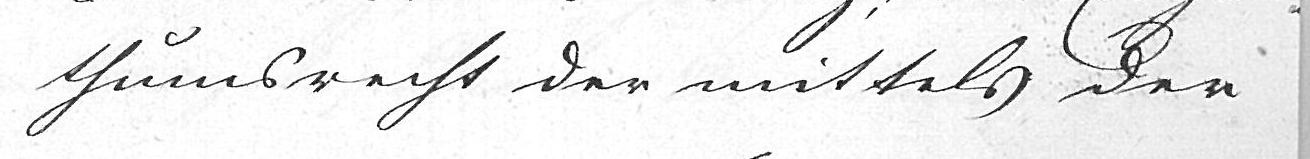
thumsrecht der mittels der
